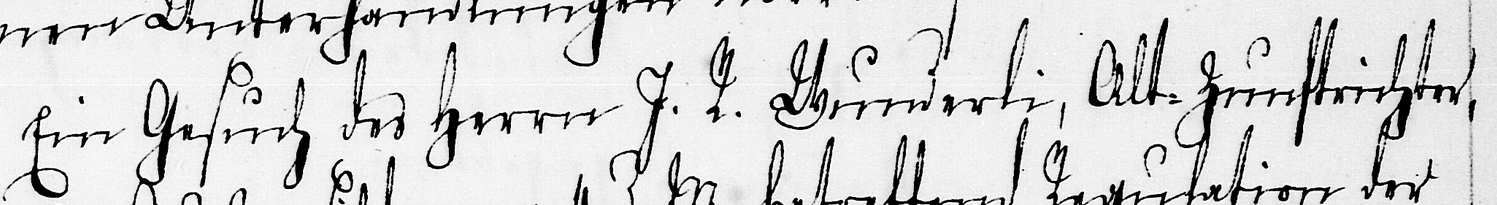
Ein Gesuch des Herrn J. R. Wunderli, Alt-Zunftrichter,
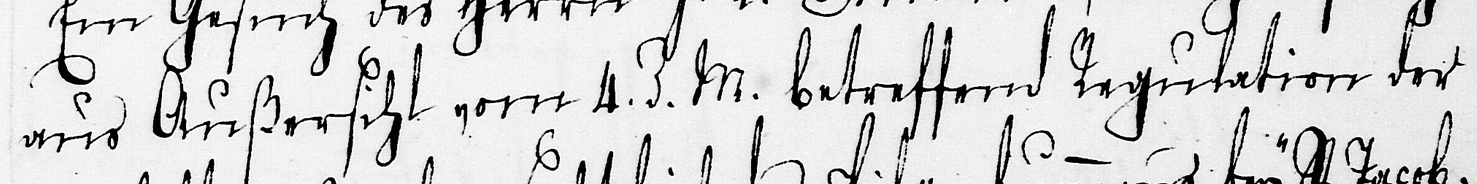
aus Außersihl vom 4. d. M. betreffend Regulation der
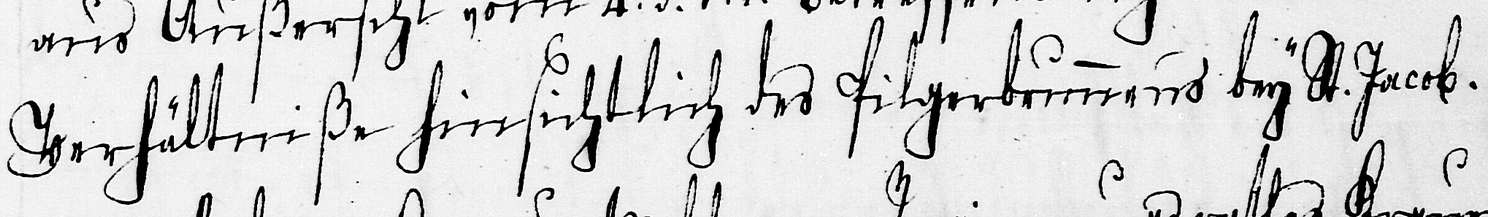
Verhältiße hinsichtlich des Pilgerbrunnens bey St. Jaco¬
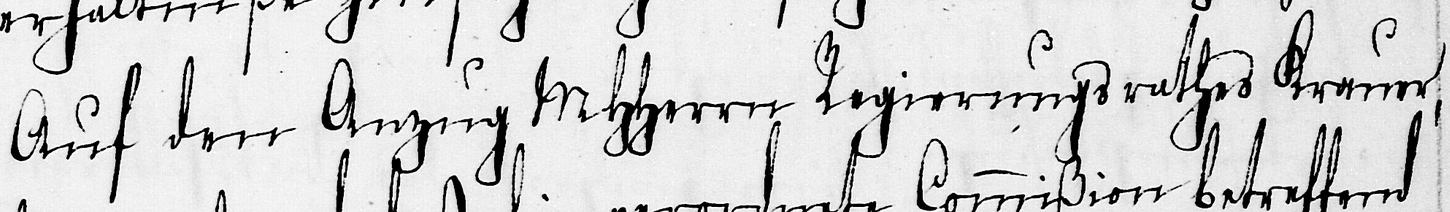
Auf den Anzug MHHerrn Regierungsrathes Krauer,
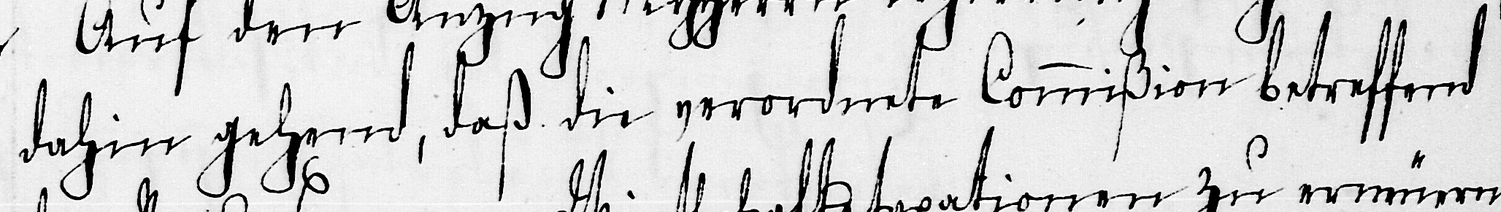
dahin gehend, daß die verordnete Commißion betreffend
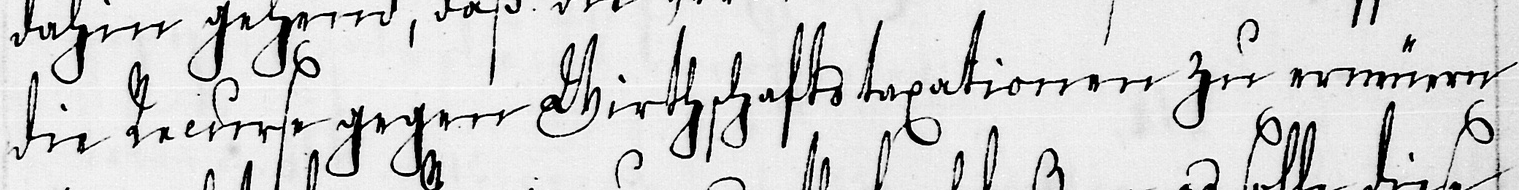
die Recurse gegen Wirthschaftstaxationen zu erneuern
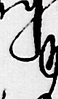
b.
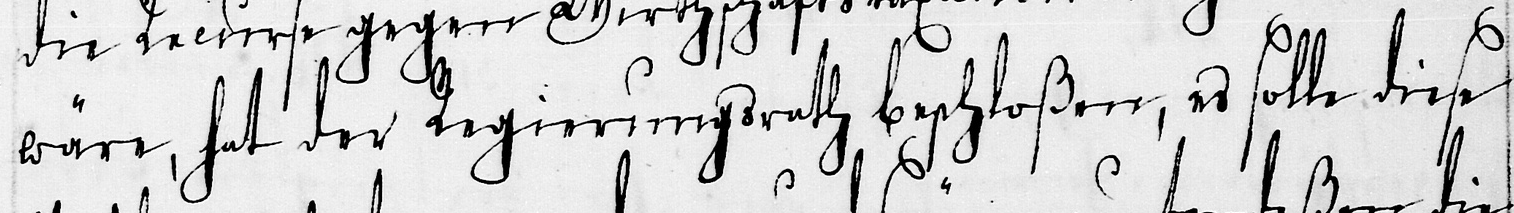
wäre, hat der Regierungsrath beschloßen, es solle diese
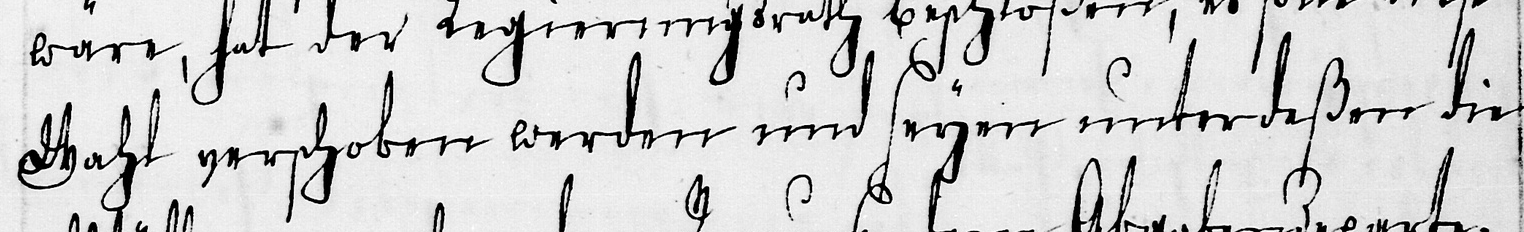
Wahl verschoben werden und seyen unterdeßen die
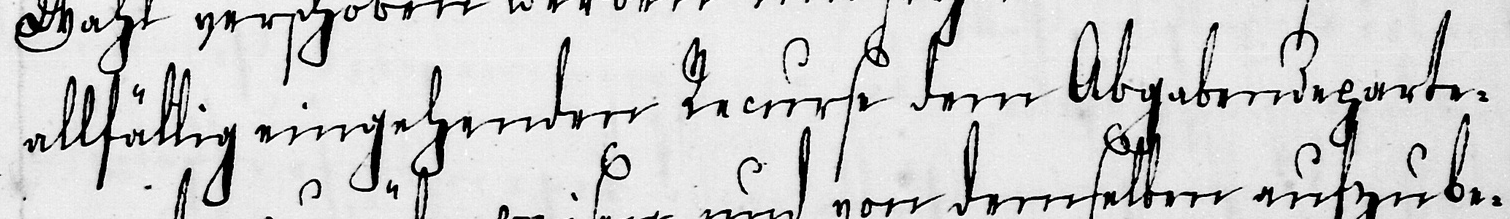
allfällig eingehenden Recurse dem Abgabendeparte¬
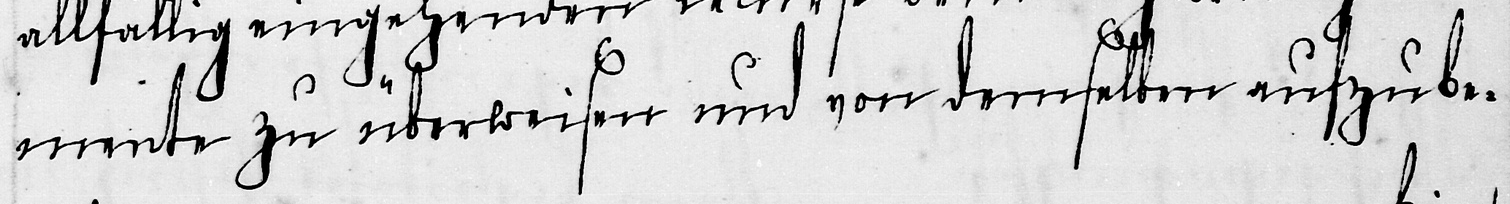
mente zu überweisen und von demselben aufzube¬
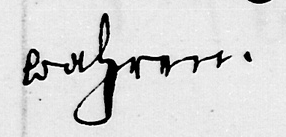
wahren.
